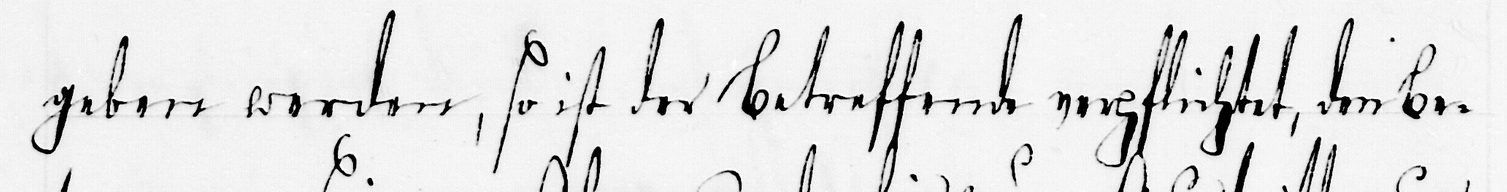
geben werden, so ist der betreffende verpflichtet, den
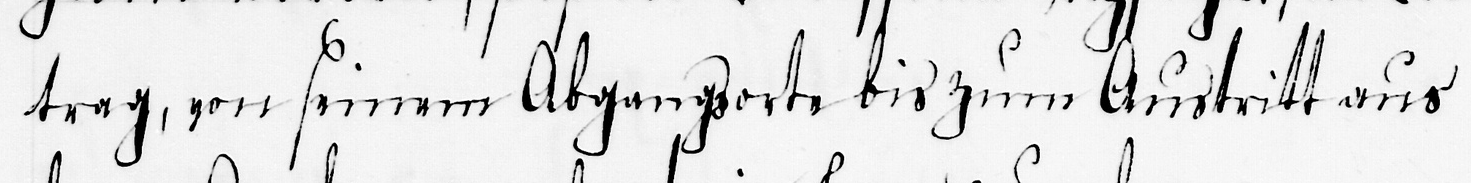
trag, von seinem Abgangsorte bis zum Austritt aus
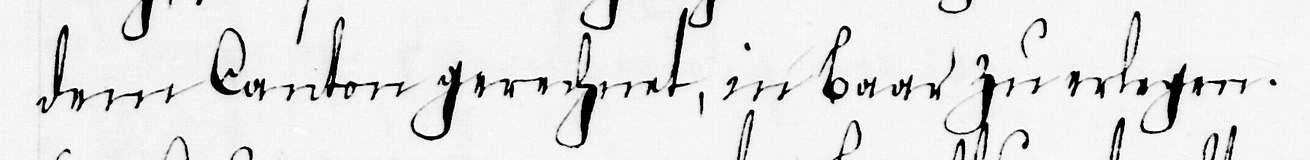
dem Canton gerechnet, in baar zu erlegen.
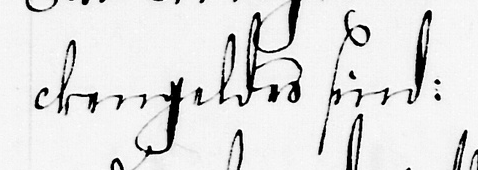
ckengeldes sind:
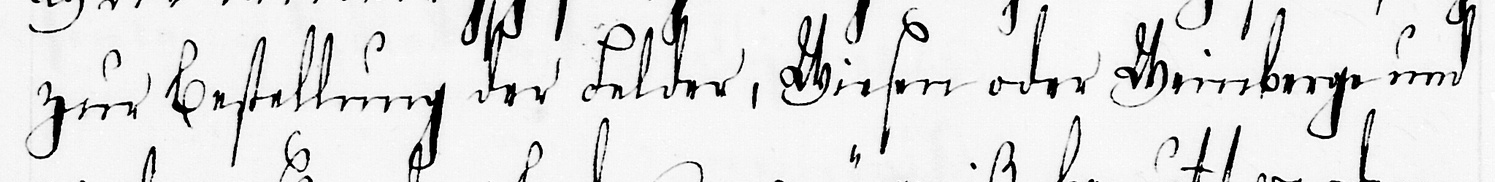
zur Bestellung der Felder, Wiesen oder Weinberge und
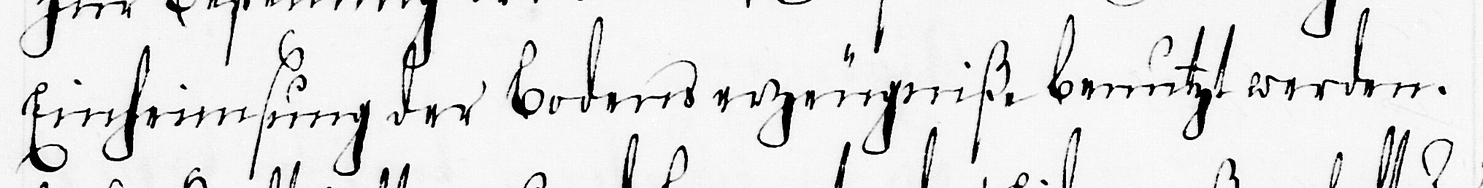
Einheimsung der Bodenserzeugniße benutzt werden.
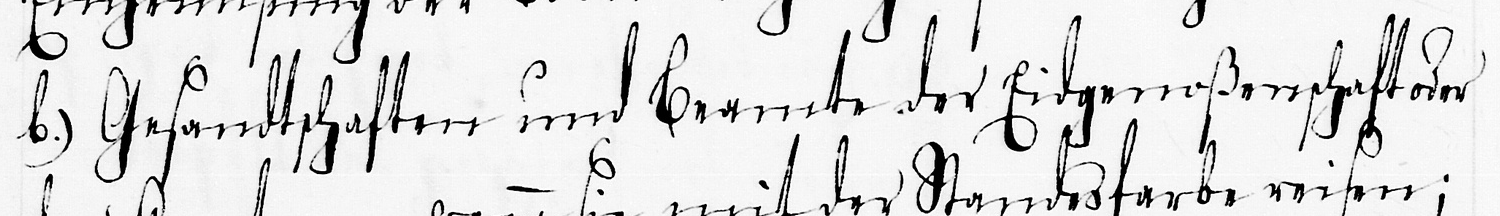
b.) Gesandtschaften und Beamte der Eidgenoßenschaft o¬
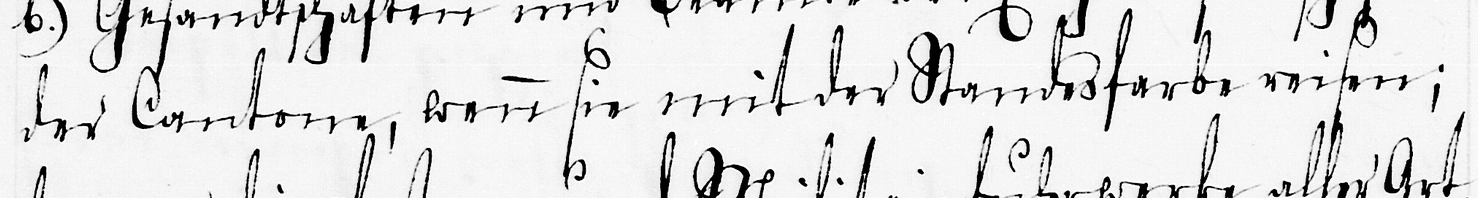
der Cantone, wenn sie mit der Standesfarbe reisen;
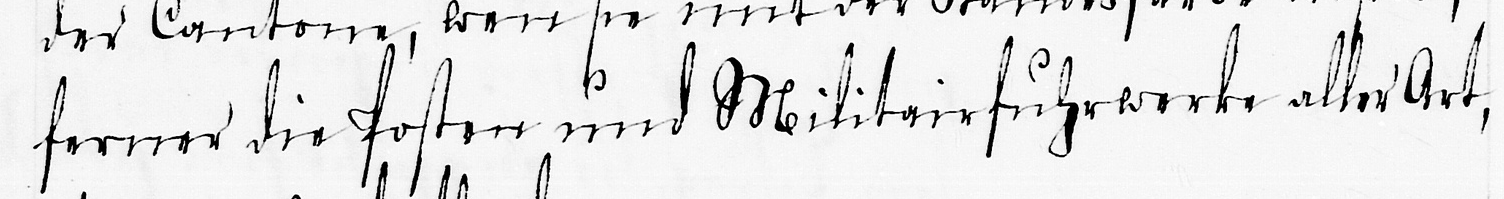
ferner die Posten und Militairfuhrwerke aller Ar¬
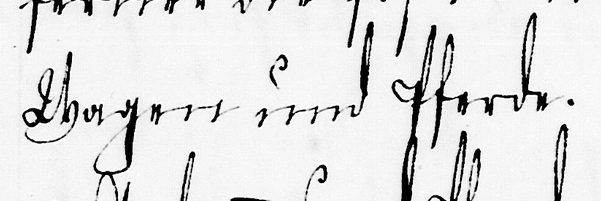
Wagen und Pferde.
